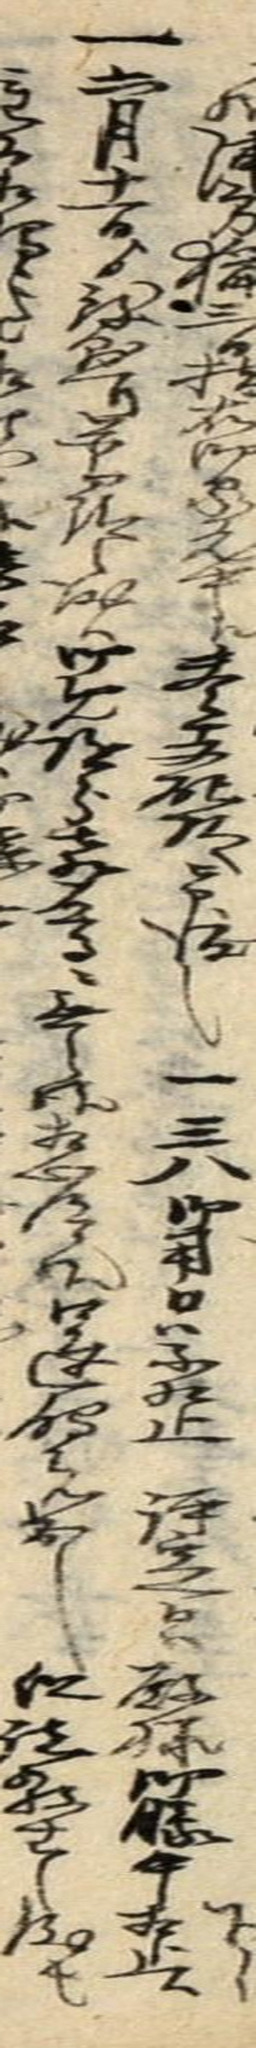一六月十一日ゟ致懸り普請之儀は御免随分高声に無之様相心得候様口達触差出之但諸殺生之儀は

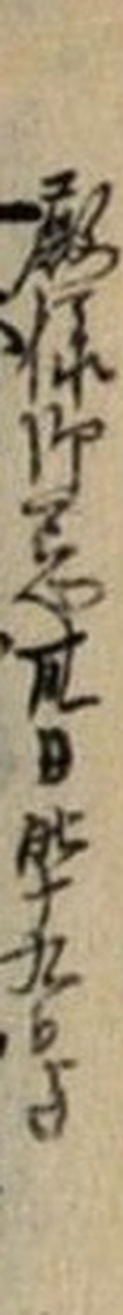殿様御忌廿日昨十九日迄
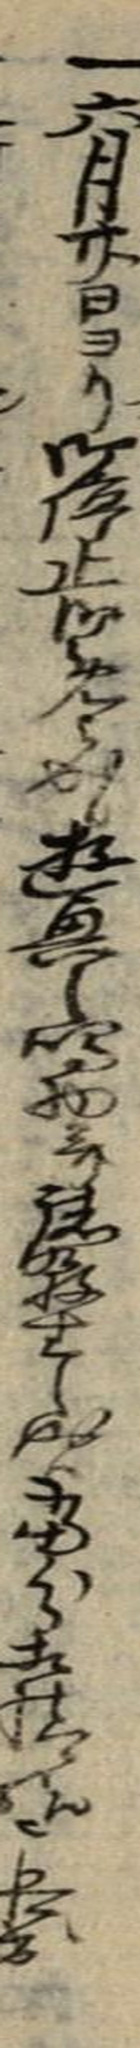一六月廿日ヨリ御停止御免被成候遊興之鳴物并諸殺生之儀当分相慎候様被仰出
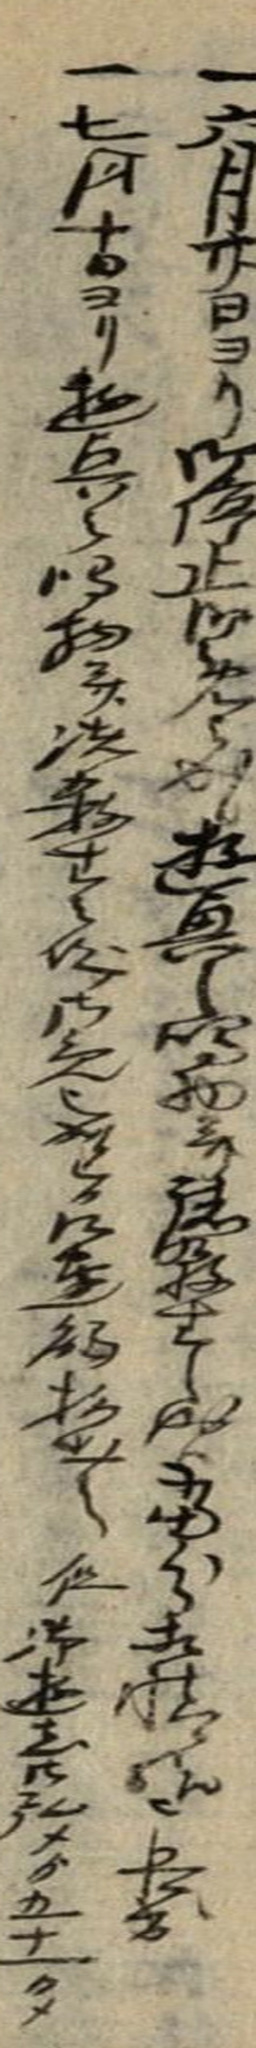一七月十日ヨリ遊興之鳴物并諸殺生之儀御免被成候旨御達触指出之但御逝去御弘メゟ五十一日メ

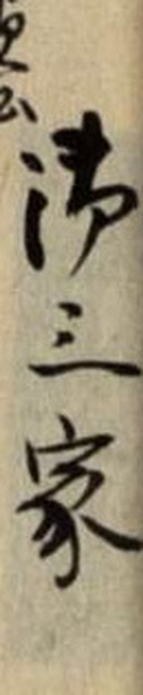御三家
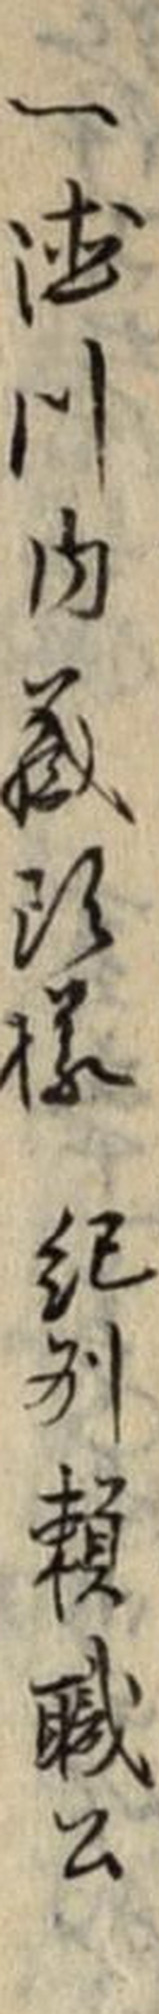一徳川内蔵頭様紀州頼職公
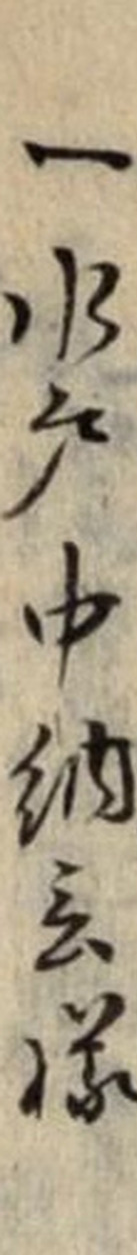一水戸中納言様
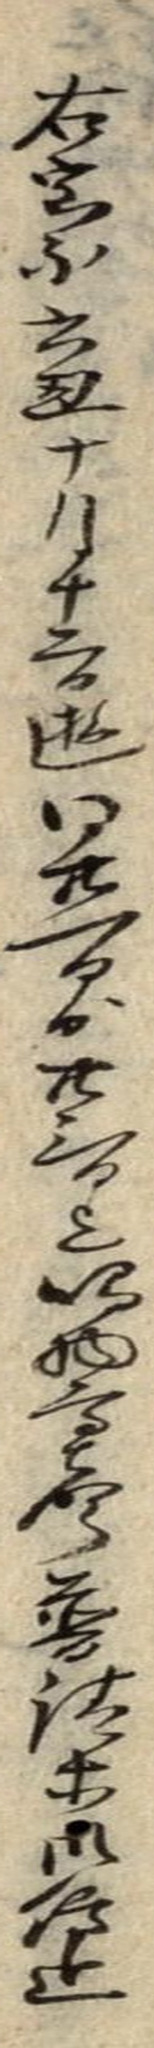右宝永六丑十月十二日逝同廿一日ゟ廿三日迄鳴物高声普請等御停止
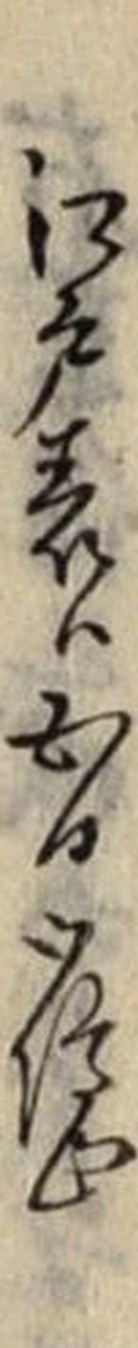江戸表は五日御停止
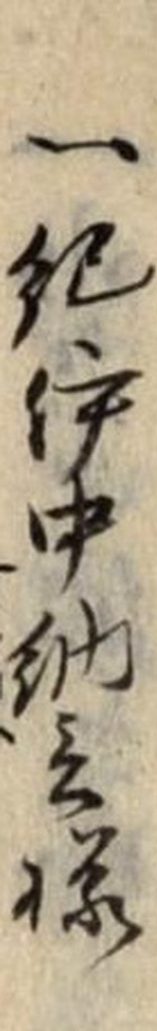一尾張中納言様
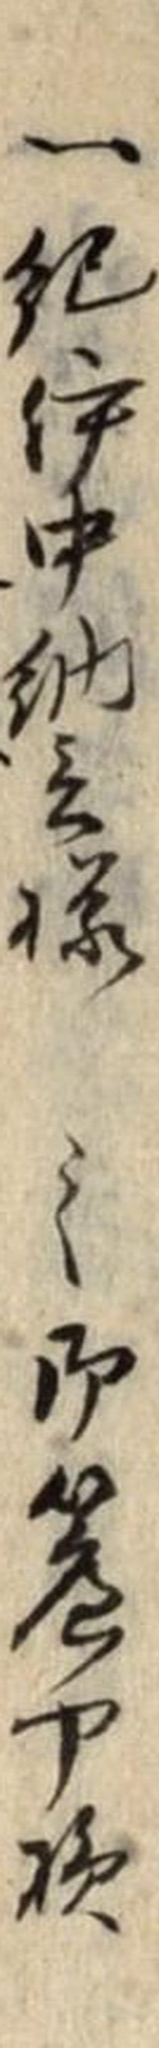一紀伊中納言様之御簾中様
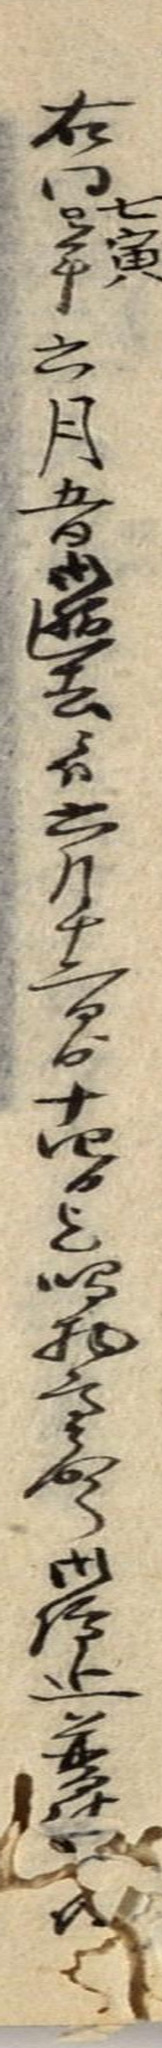右同◦年七寅六月五日御逝去に付六月十二日ゟ十四日迄鳴物高声御停止普請之儀
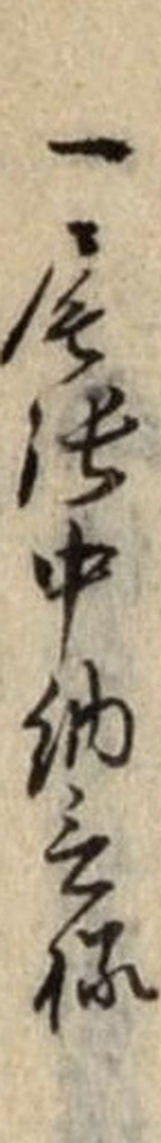一尾張中納言様
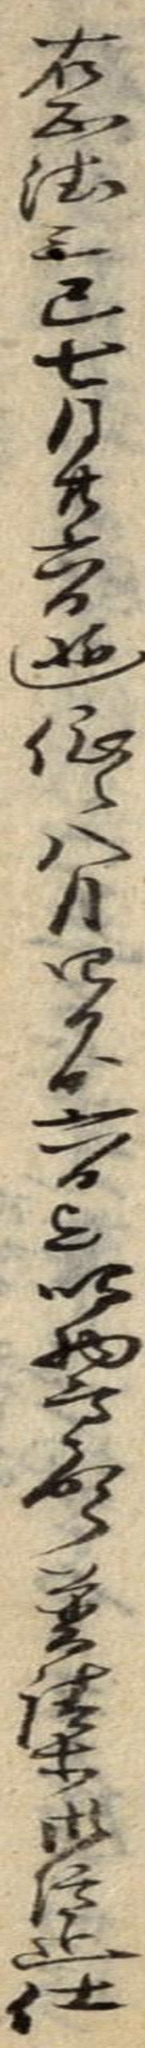右正徳三巳七月廿六日逝依之八月四日ゟ六日迄鳴物高声普請等御停止仕
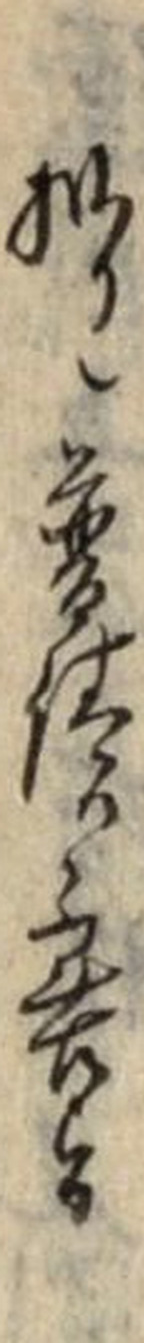掛り候普請は不苦旨

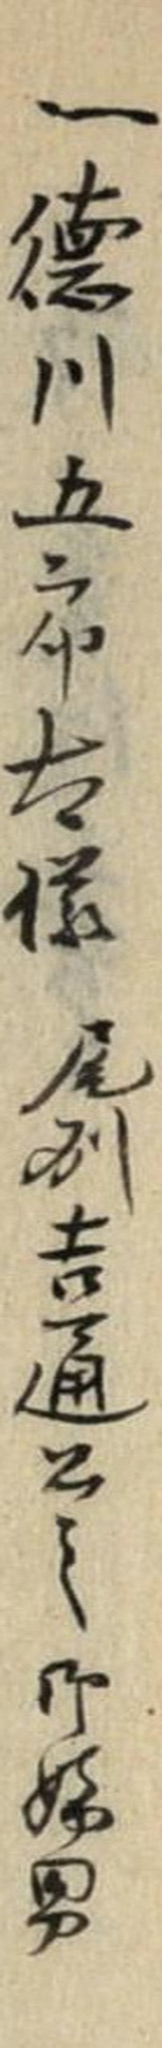一徳川五郎太様尾州吉通公之御嫡男
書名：御停止異変死失
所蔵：福井県文書館 Fukui Prefectural Archives
